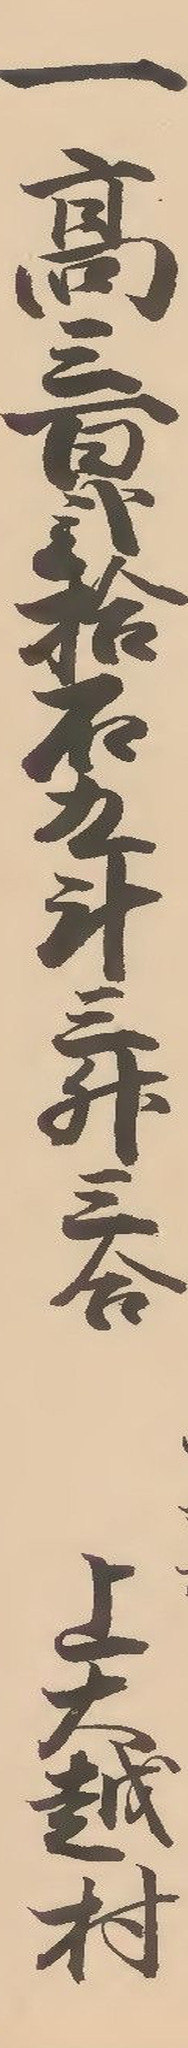一高三百弐拾石九斗三升三合上大越村
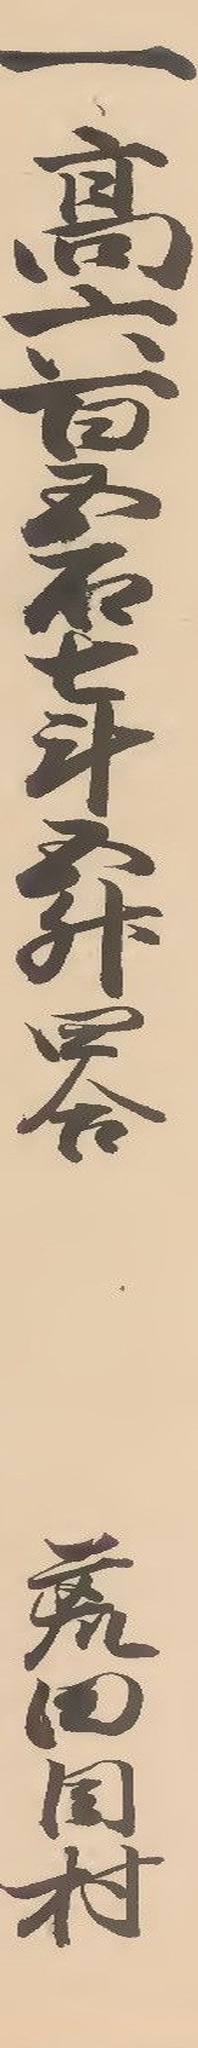一高六百五石七斗五升四合荒田目村
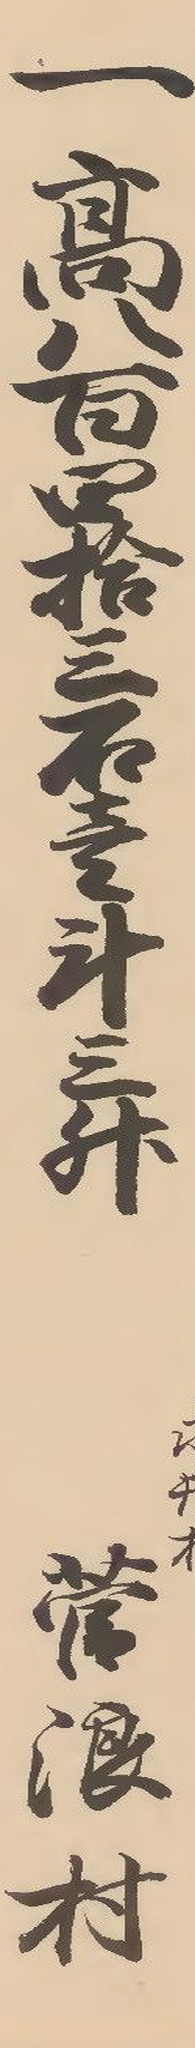一高八百四拾三石壱斗三升菅浪村
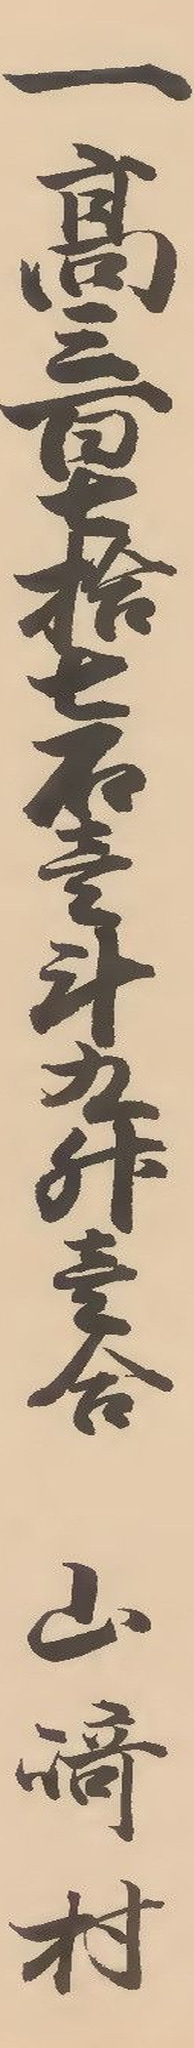一高三百七拾七石壱斗九升壱合山崎村

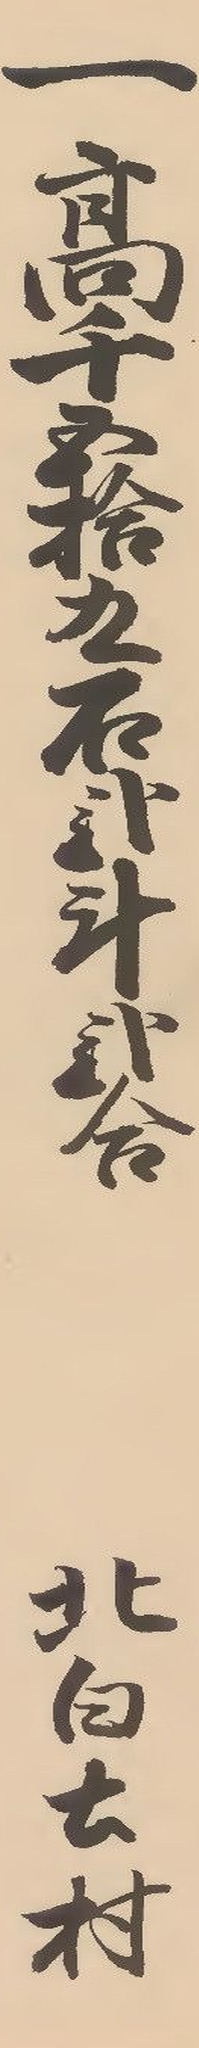一高千五拾九石弐斗弐合北白土村
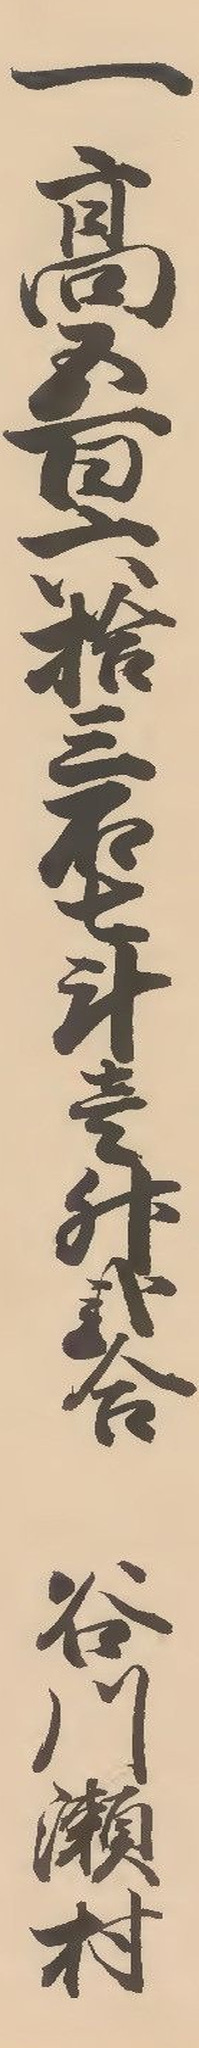一高五百六拾三石七斗壱升弐合谷川瀬村
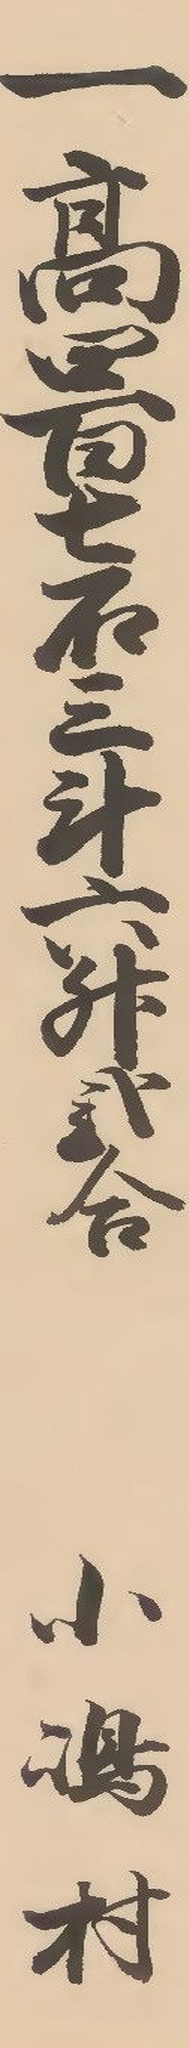一高四百七石三斗六升弐合小島村
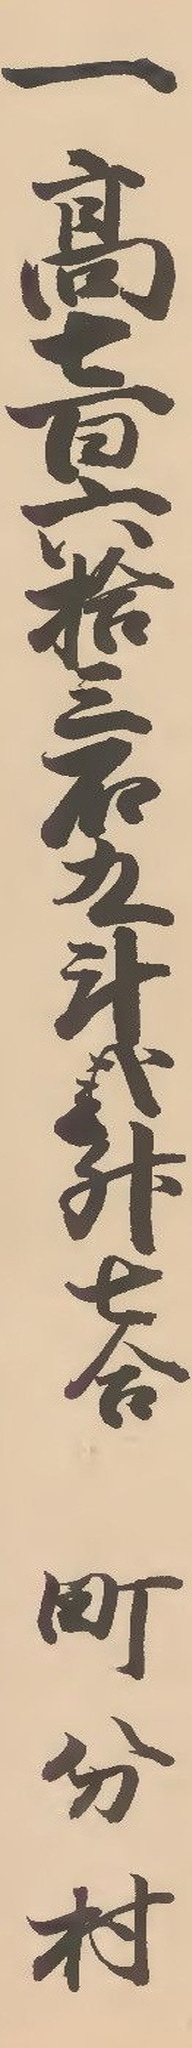一高七百六拾三石九斗弐升七合町分村
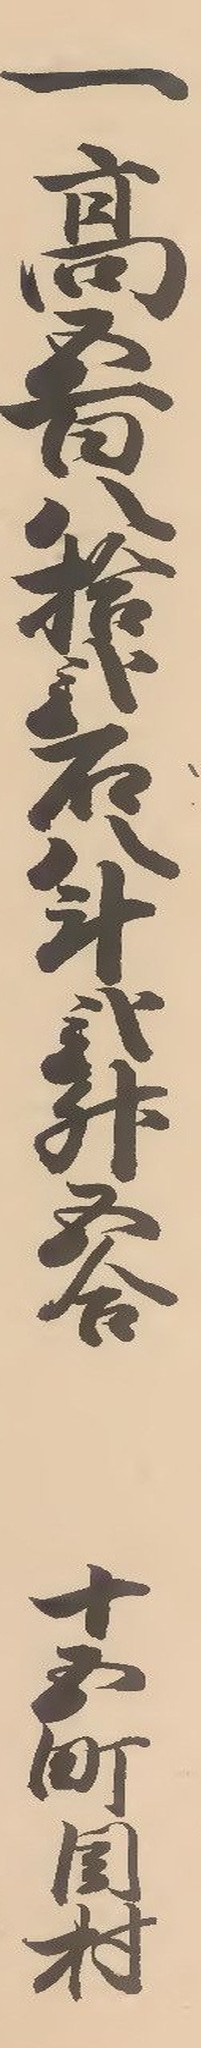一高五百八拾弐石八斗弐升五合十五町目村
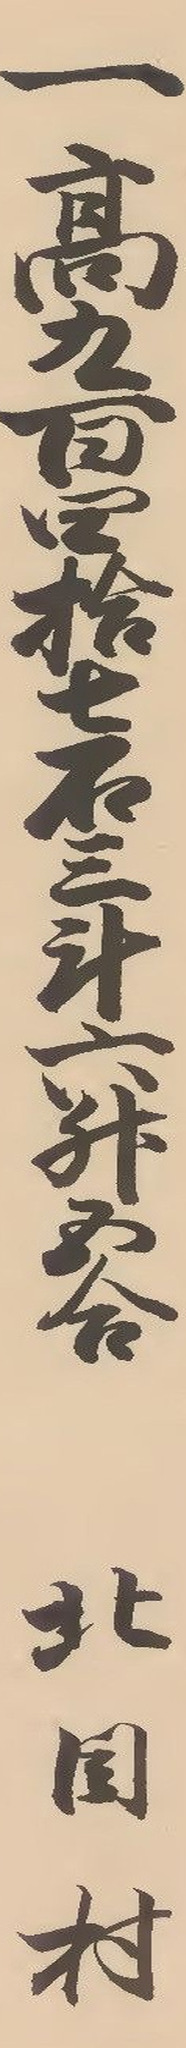一高九百四拾七石三斗六升五合北目村
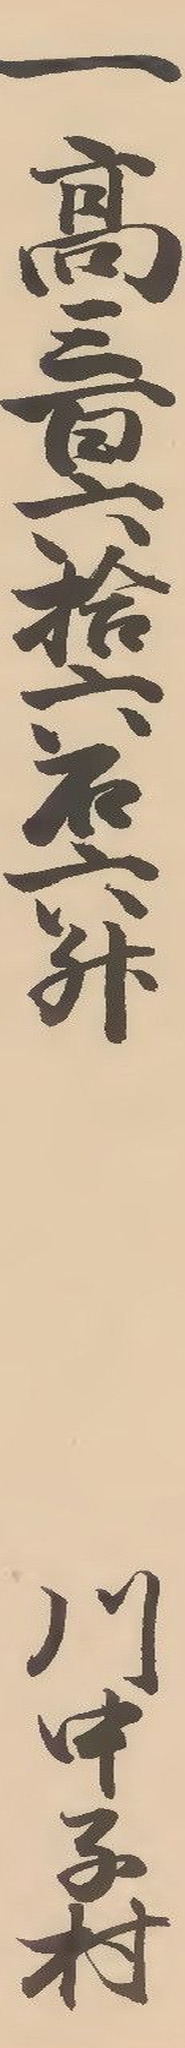一高三百六拾六石六升川中子村
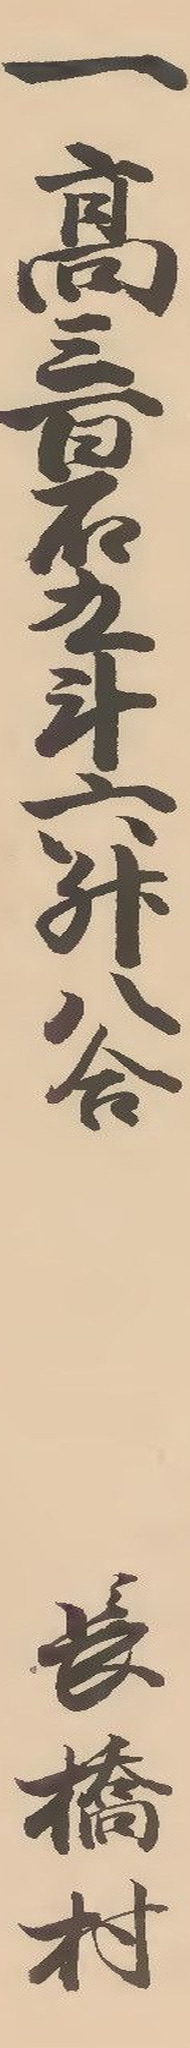一高三百石九斗六升八合長橋村

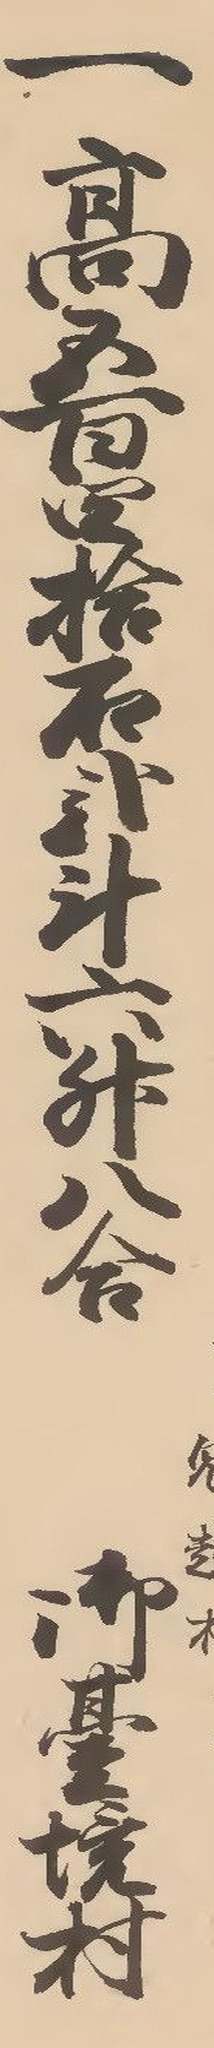一高五百四拾石弐斗六升八合御台境村
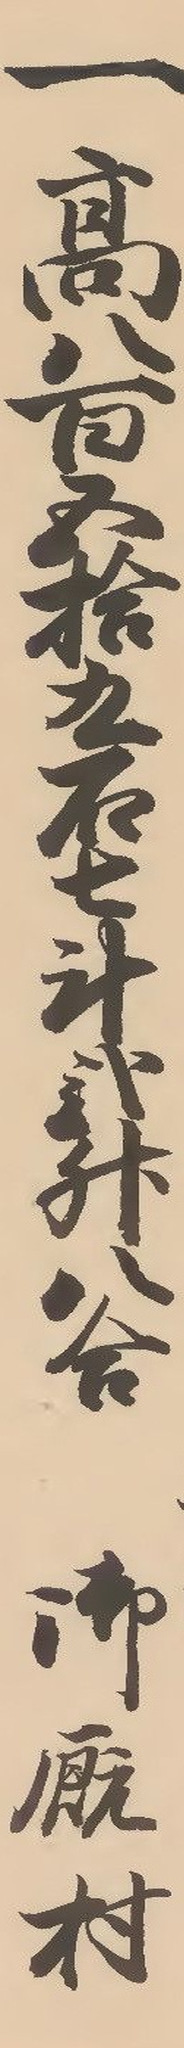一高八百五拾九石七斗弐升八合御厩村
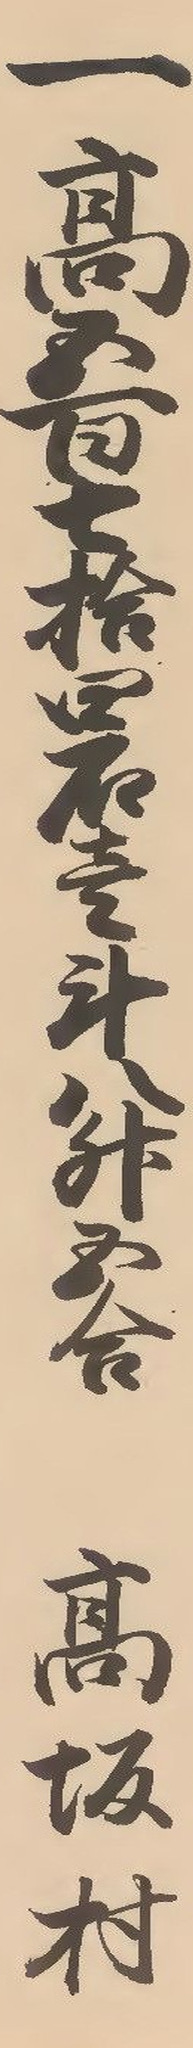一高五百七拾四石壱斗八升五合高坂村
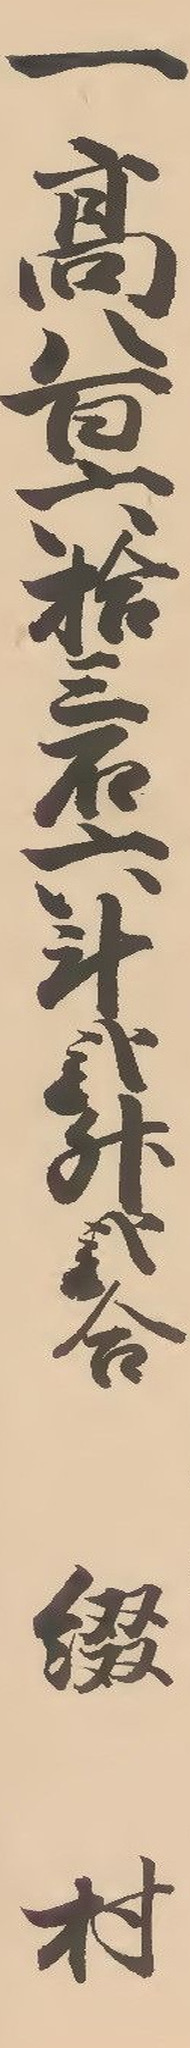一高八百六拾三石六斗弐升弐合綴村
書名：陸奥国郷帳　３
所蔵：国立公文書館 National Archives of Japan
